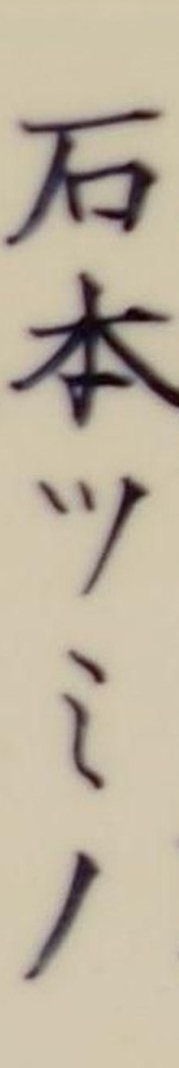石本ツミノ
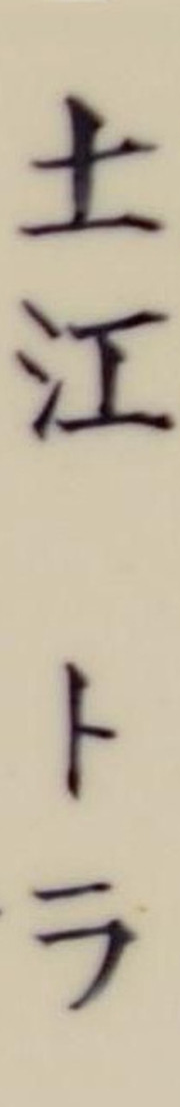土江トラ
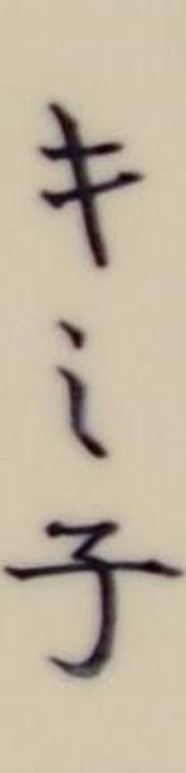キミ子
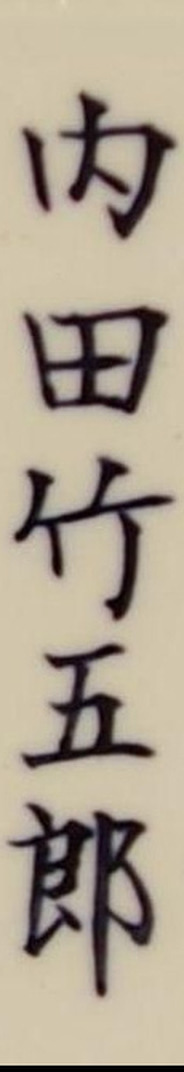内田竹五郎
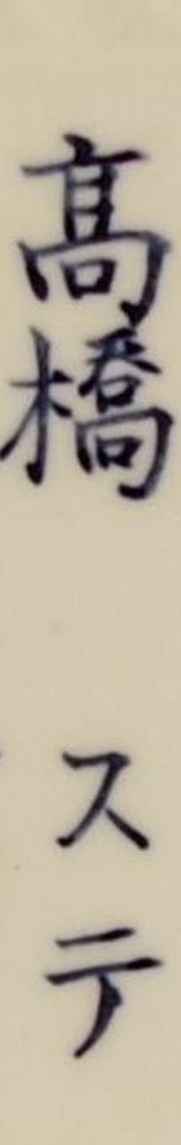高橋ステ
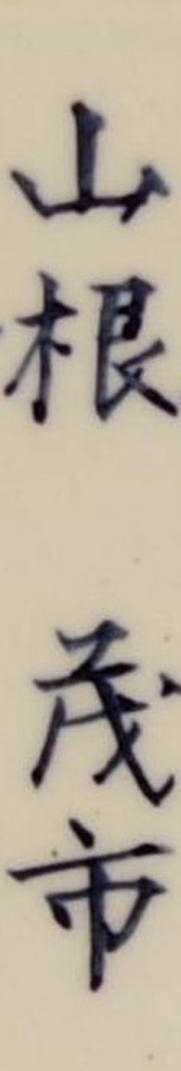山根茂市
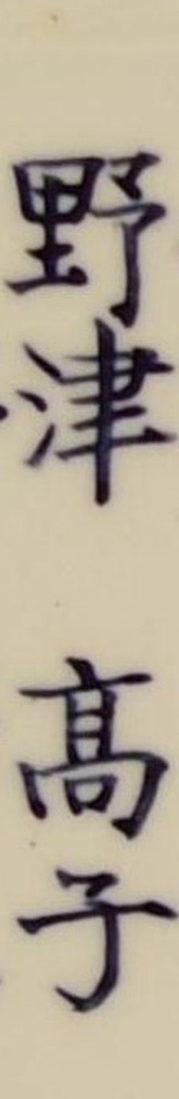野津高子
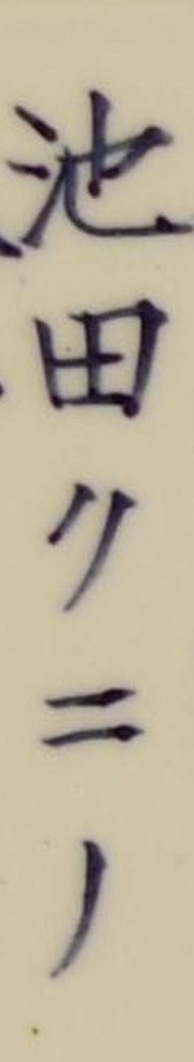池田クニノ
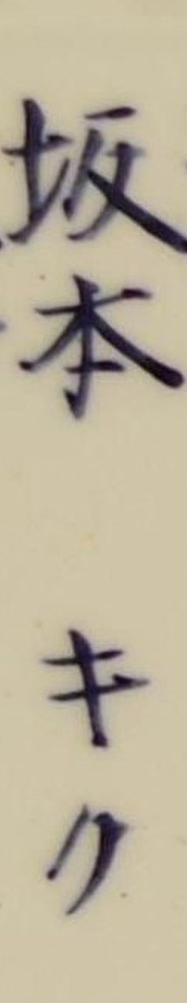坂本キク
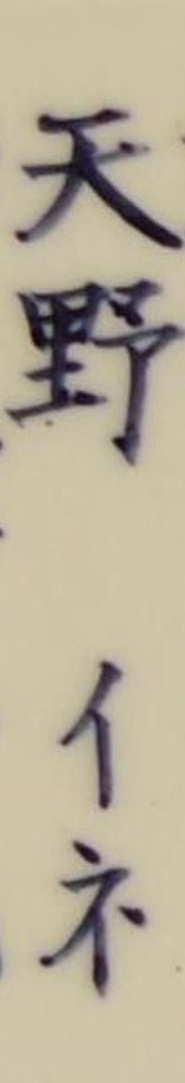天野イネ
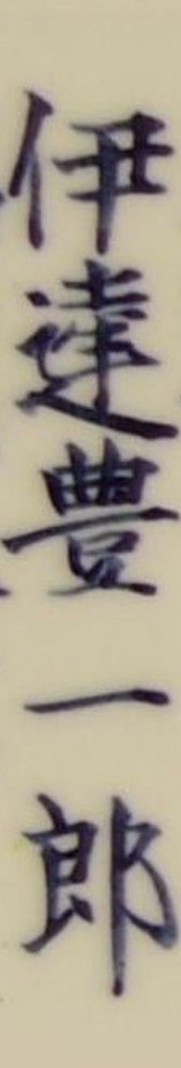伊達豊一郎
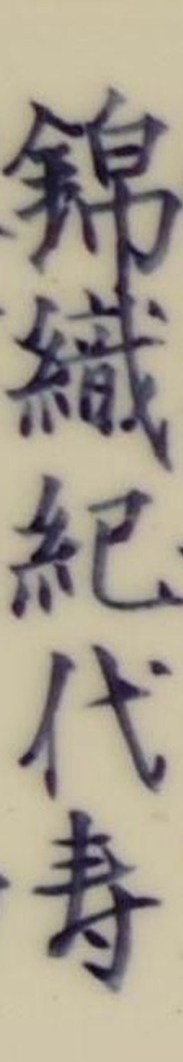錦織紀代寿
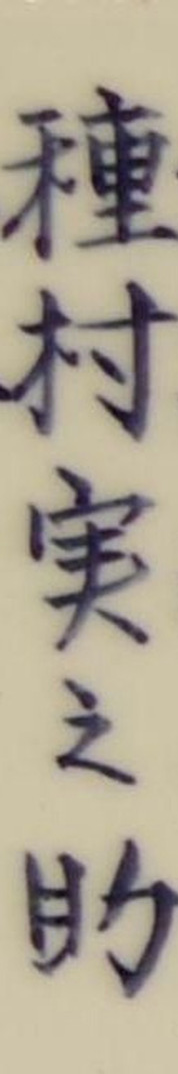種村実之助
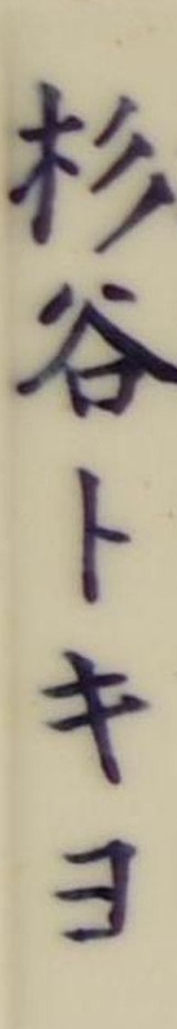杉谷トキヨ

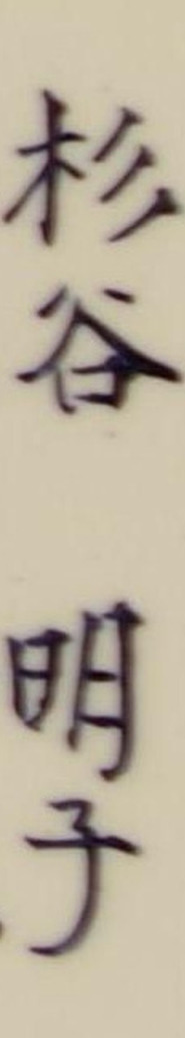杉谷明子
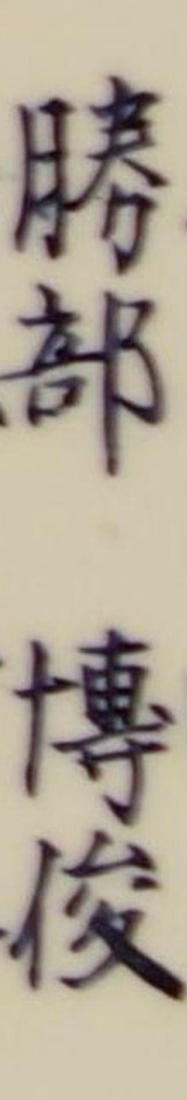勝部博俊
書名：E~L
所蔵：高野山金剛峯寺
